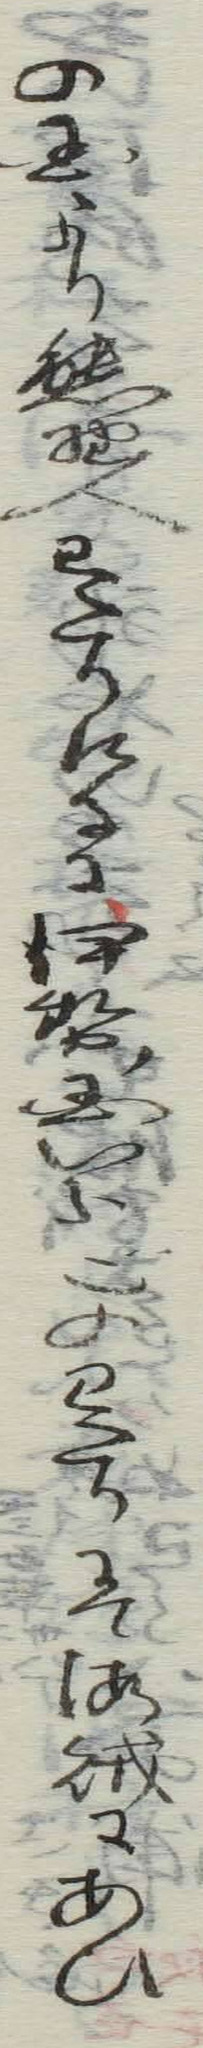の国より熊野へわたりけるに、伊勢国いらこのわたりにて海賊にあひ
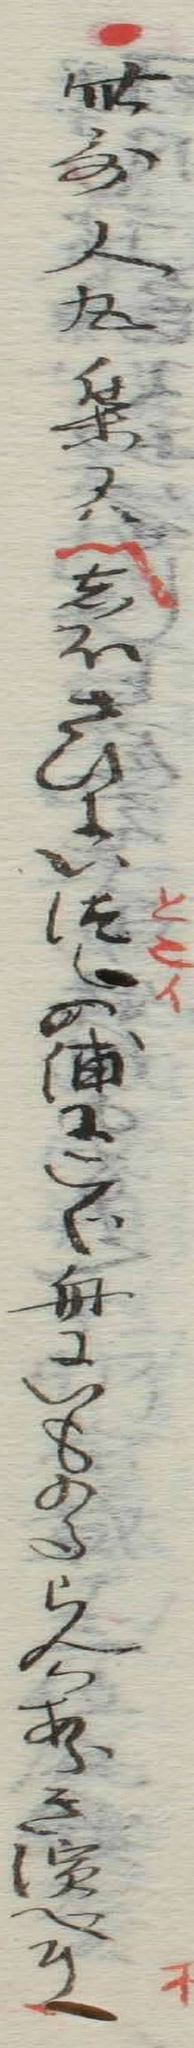●此歌人丸集には〽しほさひにいつしの浦にこぐ舟にいものるらんかあらき浜べに
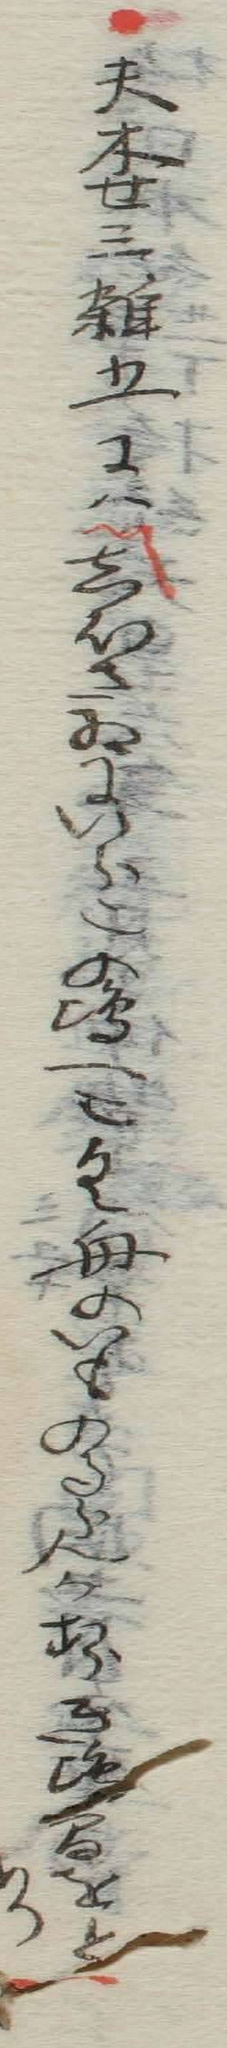●夫木廿三雑五には〽しほさゐにいらこの島へこく舟のいものるらんかあらき島間をとあり
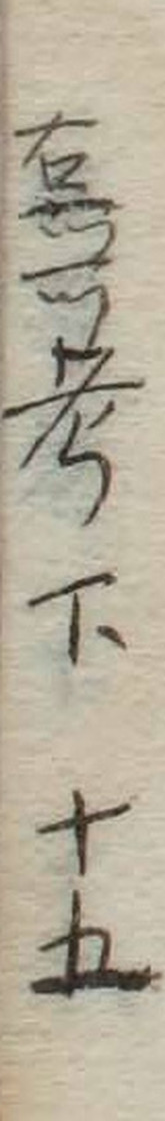古歌考下十五

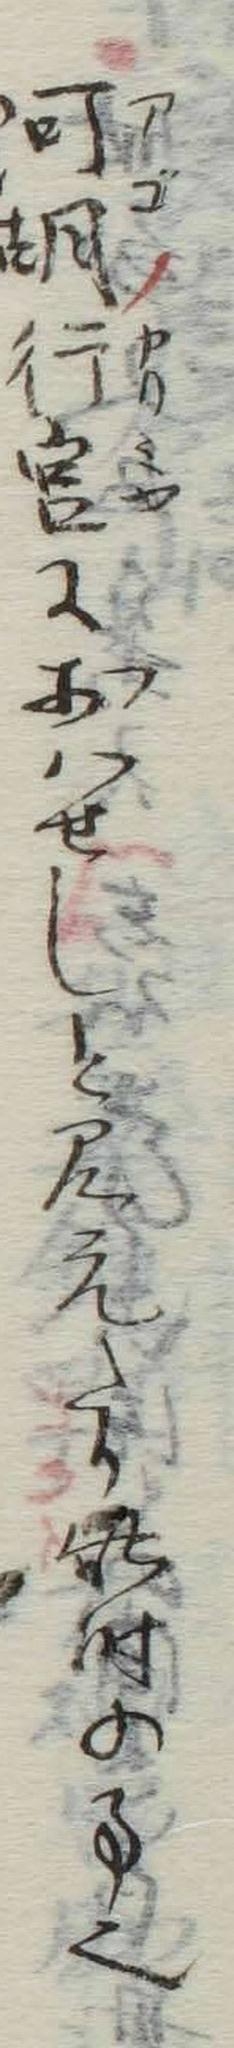阿胡行宮におはせしと見えたり此時の事也
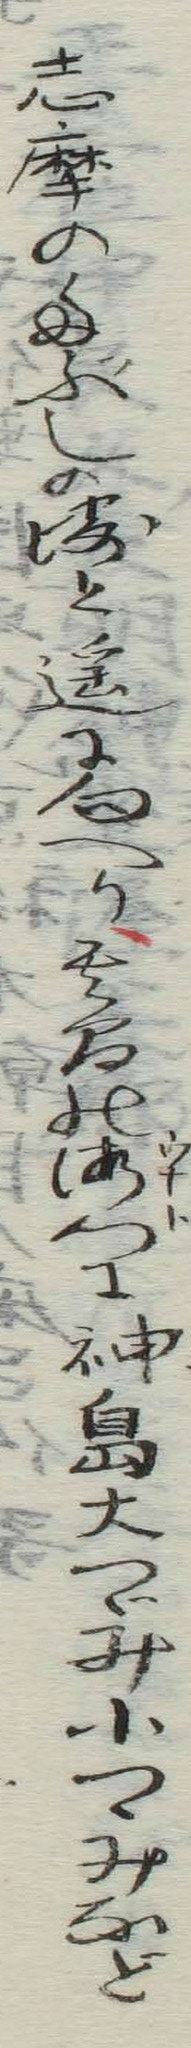志摩のたぶしの崎と遥に向へり、其間の海門に神島大つゞみ小つゝみなど
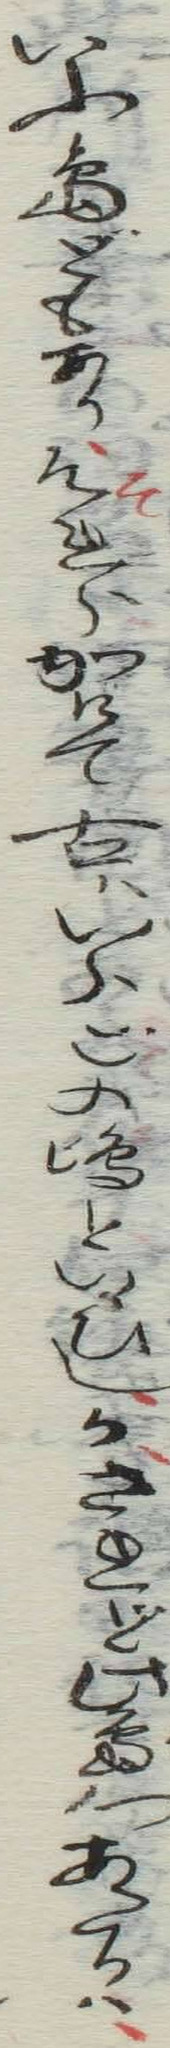いふ島どもあり、それらかけて古はいらごの嶋といひし、か、されど此島門あたりは、
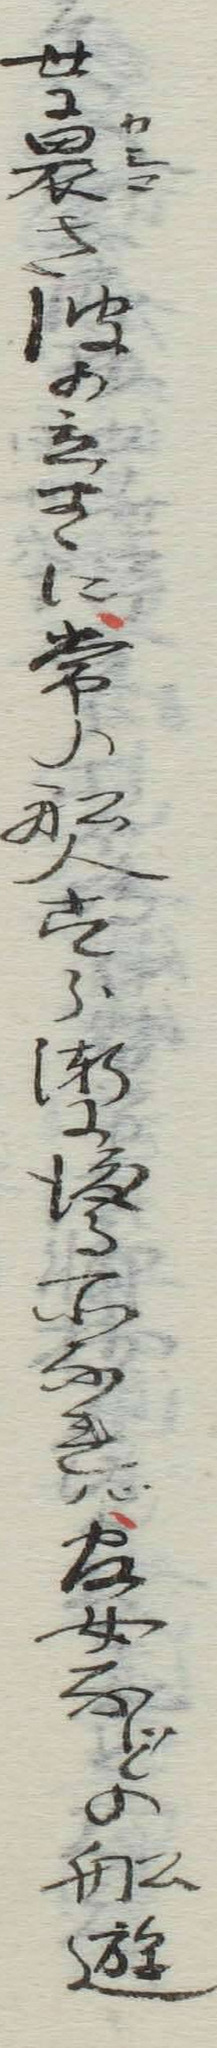世に畏き波の立まゝに、常の船人すら漸に渡る所なれば、官女などの船遊
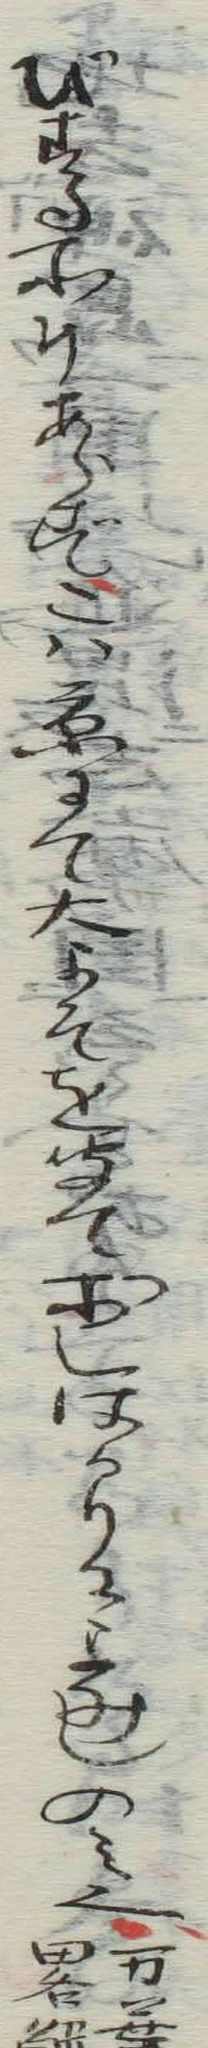びする所にあらず、こは京にて大よそを聞ておしはかりによみしのみ也、●万葉略解
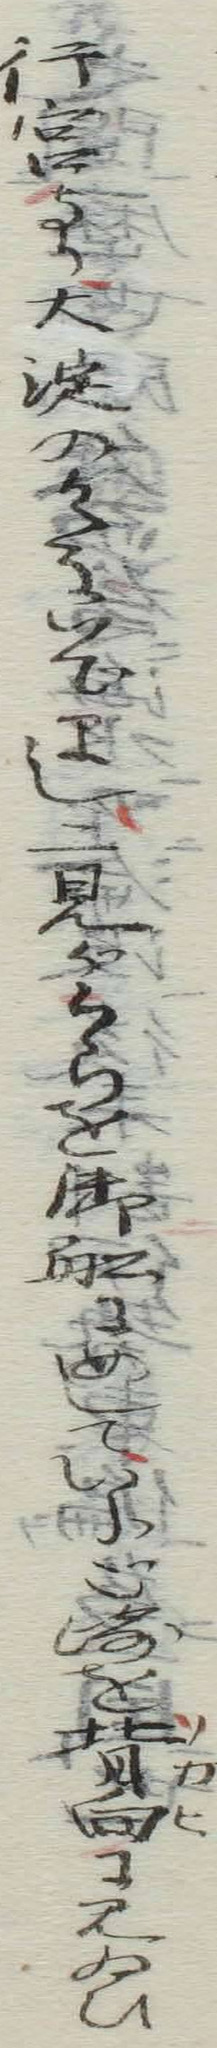行宮より、大淀のかたにいでまし、二見がうらを御船にめして、いらご崎を背向に見給ひ
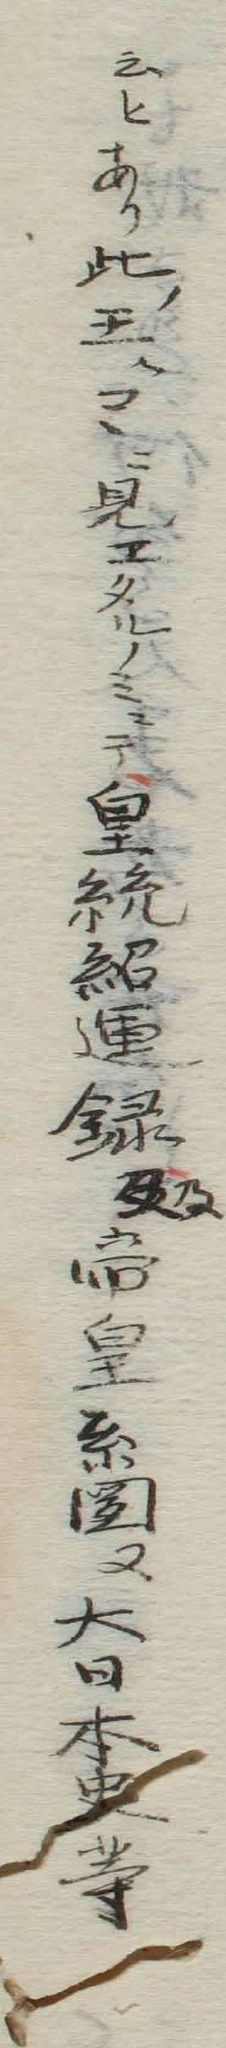云とあり此王ハコヽニ見エタルノミニテ、皇統紹運録及帝皇系図又大日本史等
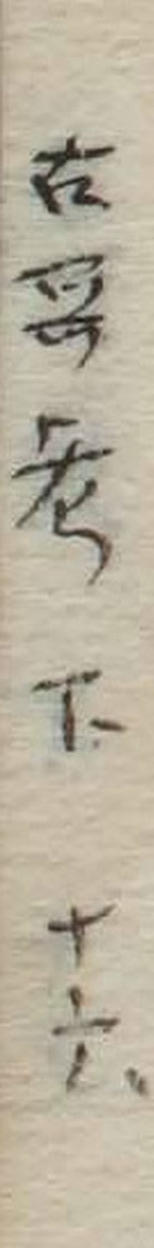古歌考下十六

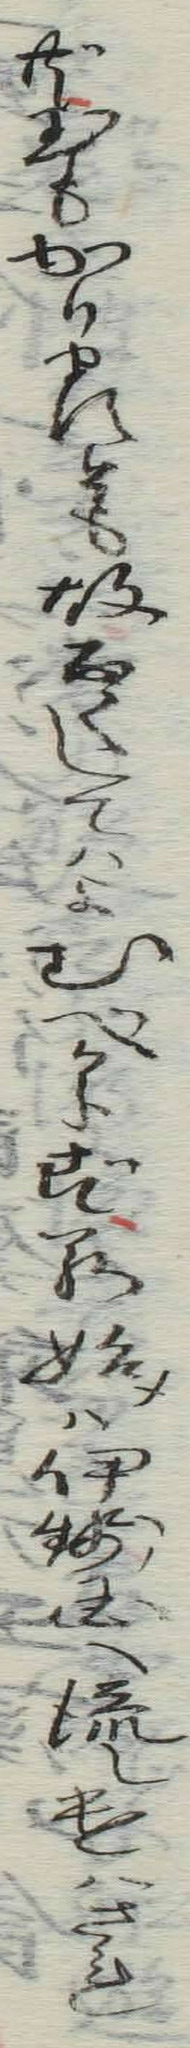共、玉もかりますとも故なくしてはよむべからず、若始は伊勢国へ流し遣はされ
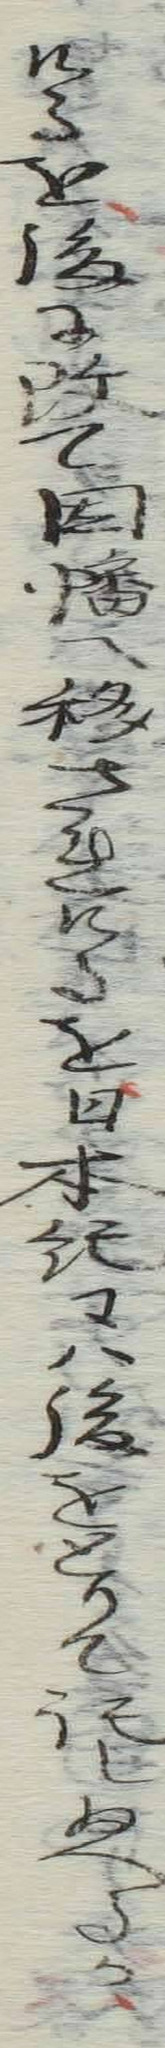けるを、後に改て因幡へ移されけるを、日本紀には後をとりて記し給へるか、
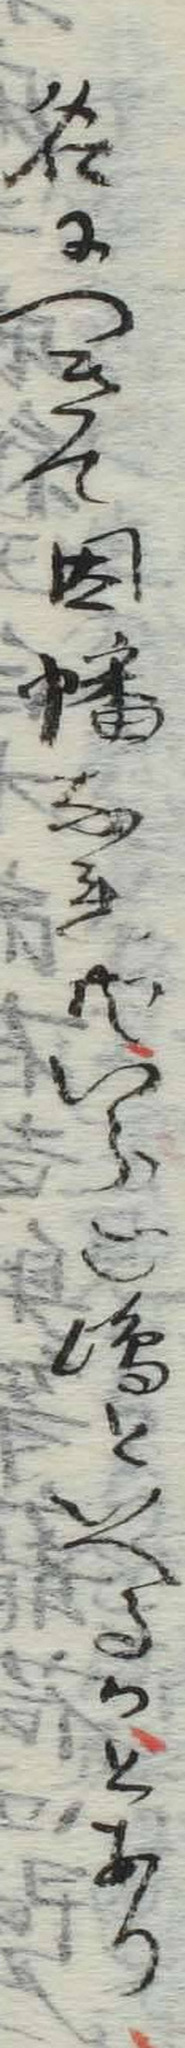名につきて因幡なれ共、いらご嶋といへるか、とあり、
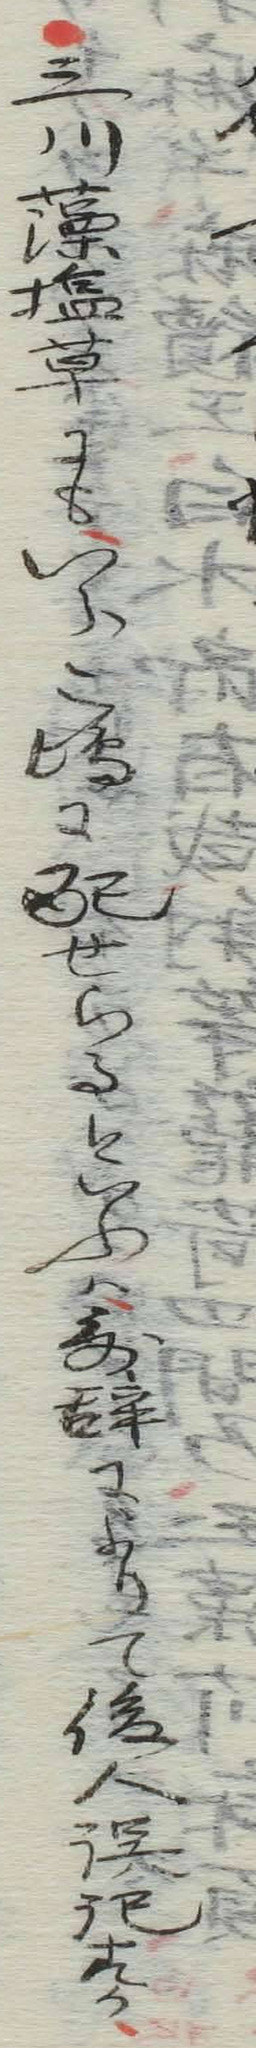●三川藻塩草にも、いらご嶋に配せらるといふは、歌辞によりて後人誤記すか、
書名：三河国古跡考
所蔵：国文学研究資料館
